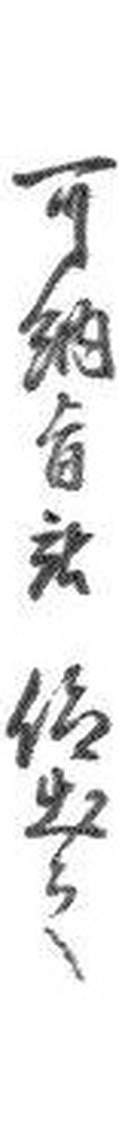可納旨被仰出之
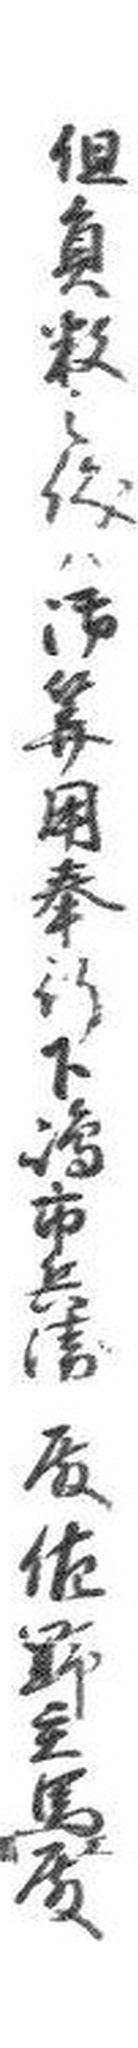但員数之儀ハ御算用奉行下嶋市兵衛殿佐野主馬殿
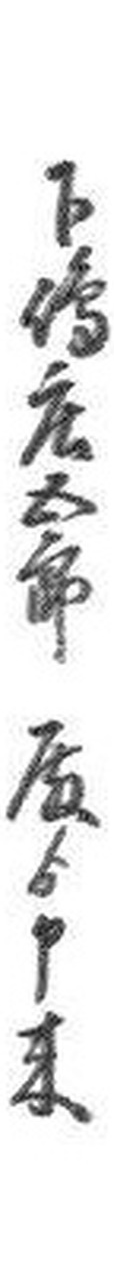下嶋庄五郎殿ゟ申来
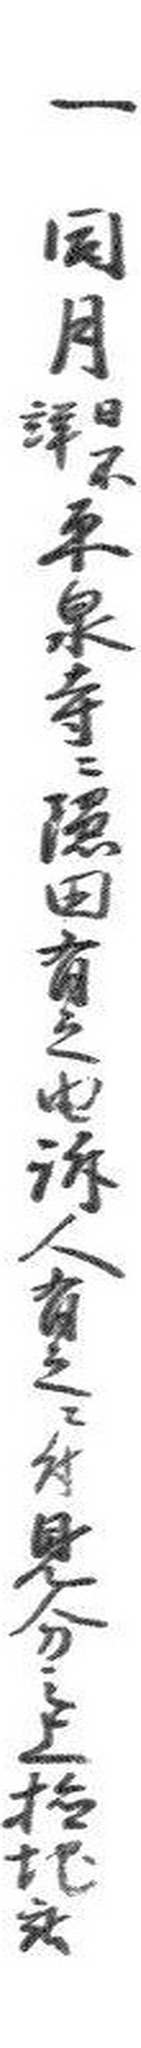一同月日不詳平泉寺ニ隠田有之由訴人有之ニ付見分之上撿地被
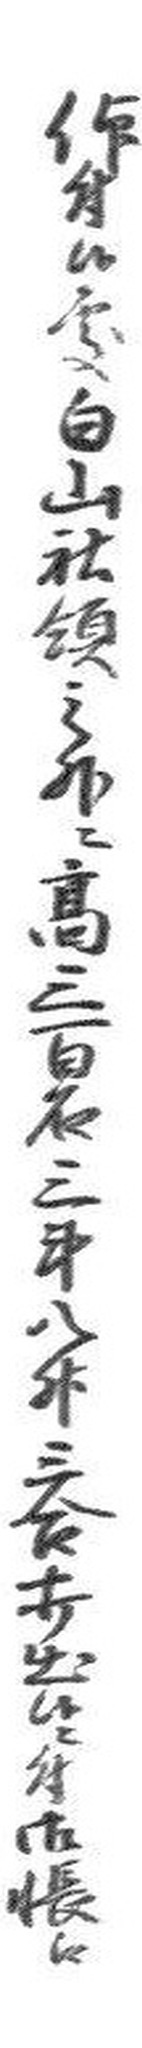仰付候処白山社領之外ニ高三百石三斗八升三合打出候ニ付御帳江
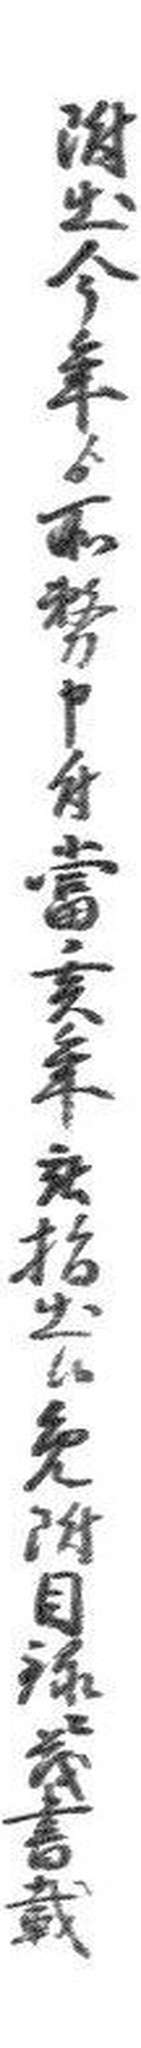附出今年ゟ所務申付当亥年被指出候免附目録ニ茂書載
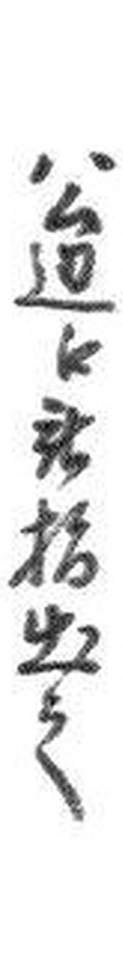公辺江被指出之
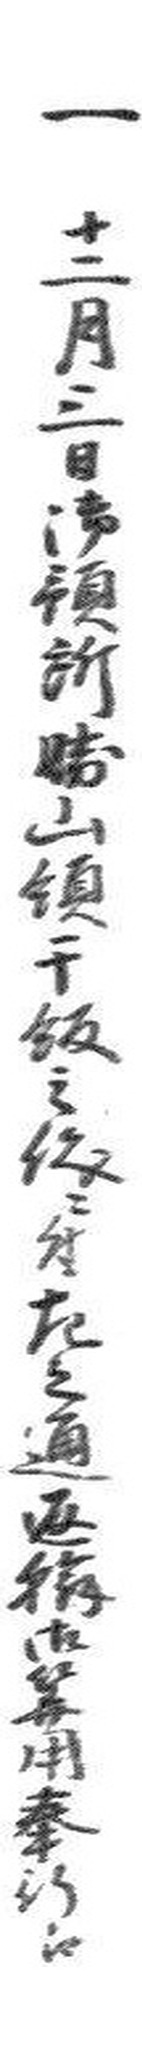一十二月三日御預所勝山領干飯之儀ニ付左之通返翰御算用奉行江
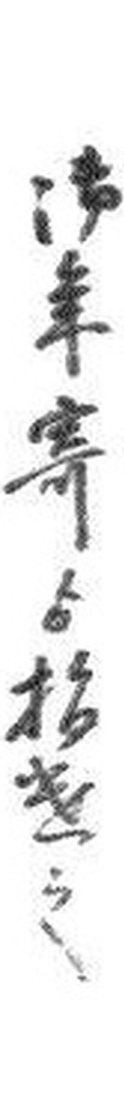御年寄ゟ指遣之
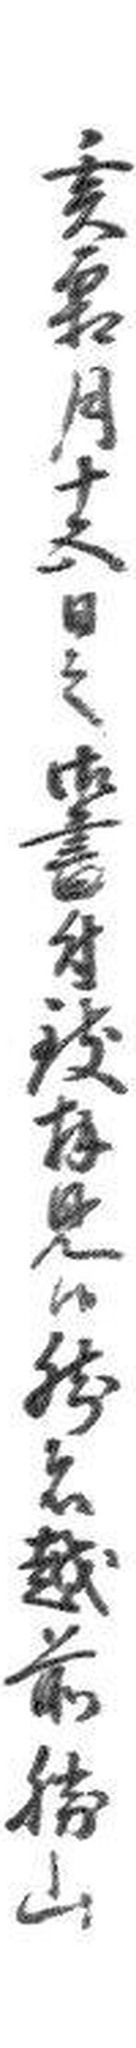亥霜月十五日之御書付致拝見候然者越前勝山
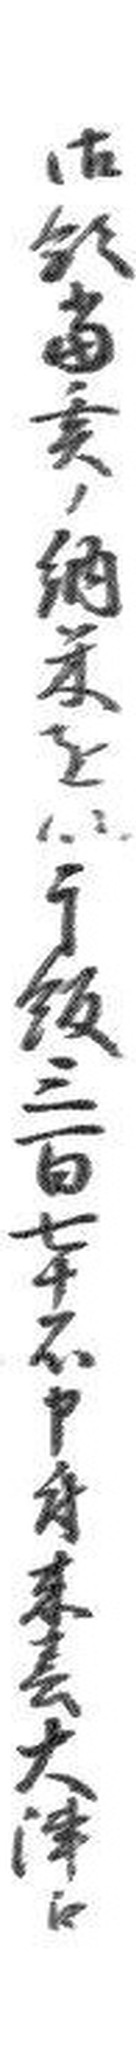御領当亥ノ納米を以干飯三百七十石申付来春大津江
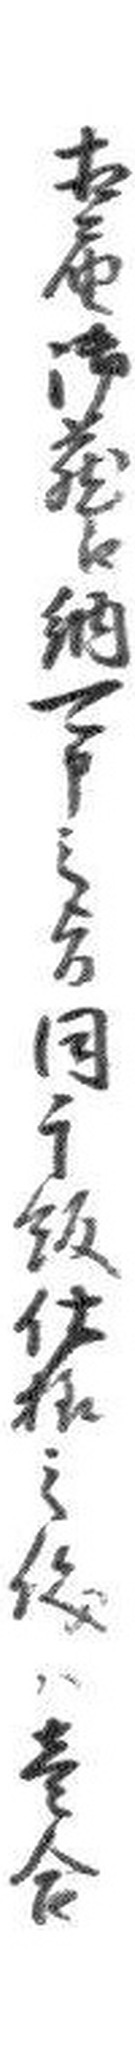相届御蔵江納可申之旨同干飯仕様之儀ハ壱合

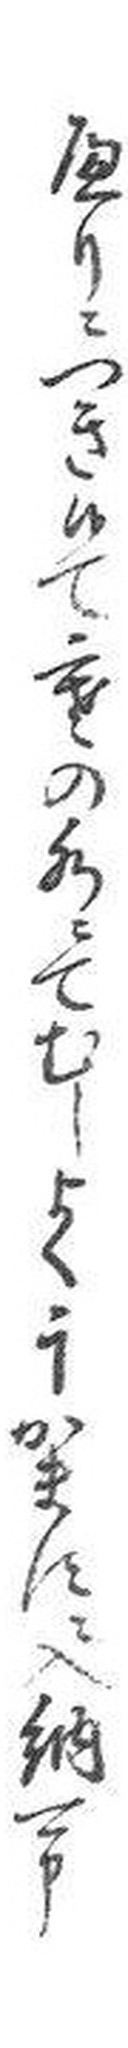へりニつき候て寒の水にてむしよく干かますニ入納可申
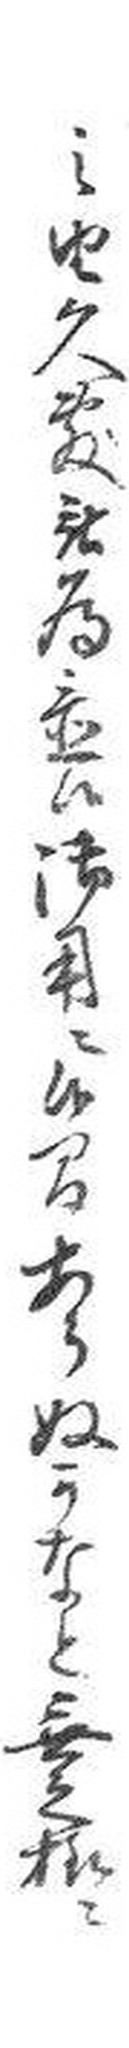之由久敷被為置候御用ニ候間あらぬかなと無之様ニ
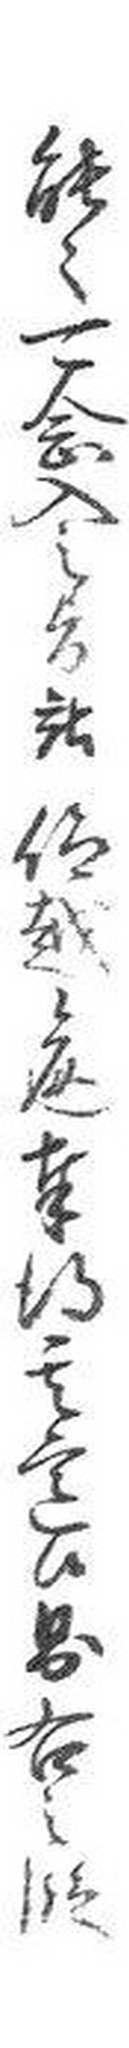能々可念入之旨被仰越候通奉得其意候則右之段
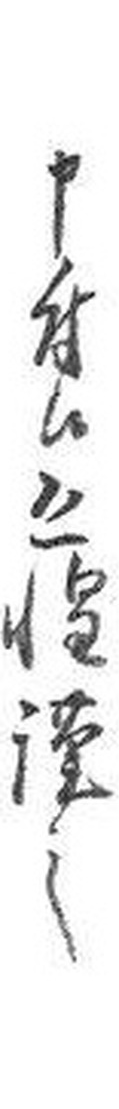申付候恐々謹言
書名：家譜 五 光通公 従寛永十三年到万治二年
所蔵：福井県文書館 Fukui Prefectural Archives
